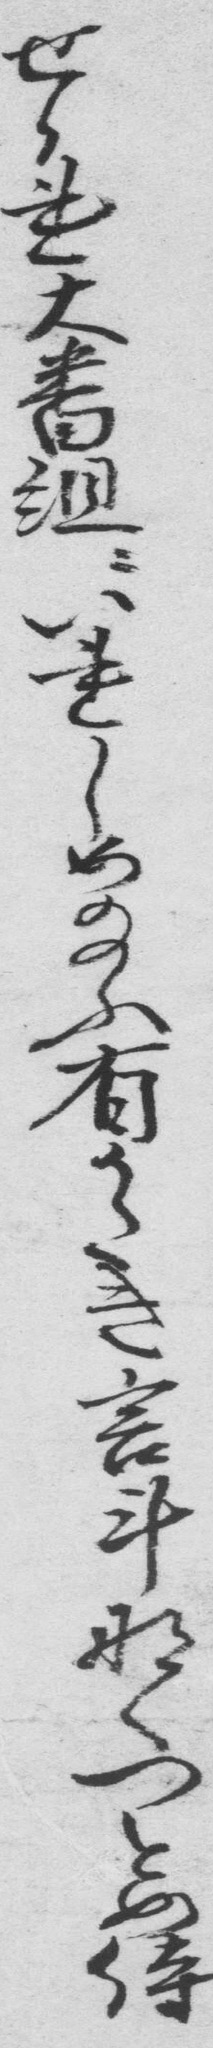せられ大番組にいれしめ給ふ有かたき言計なくつとめ侍
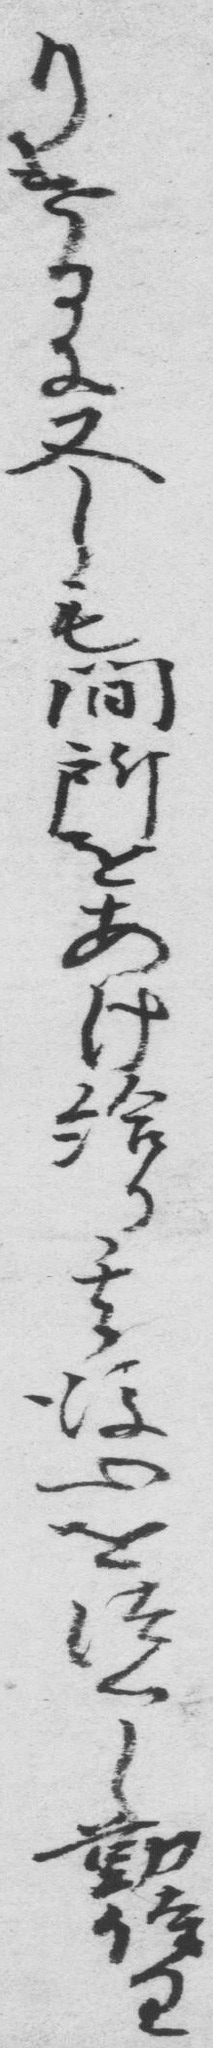りけるに又しも間所をあけ給り其後心をつくし勤侍り
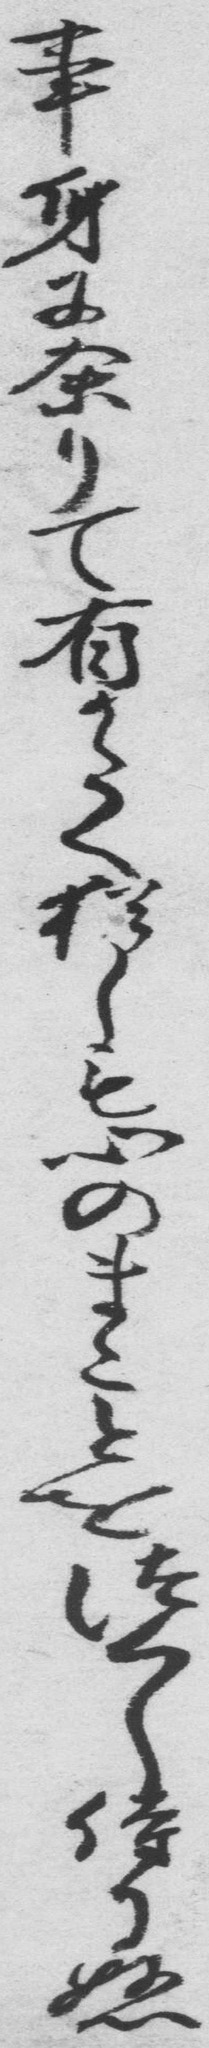事身に余りて有かたく猶しも心のまことをつくし侍りぬ
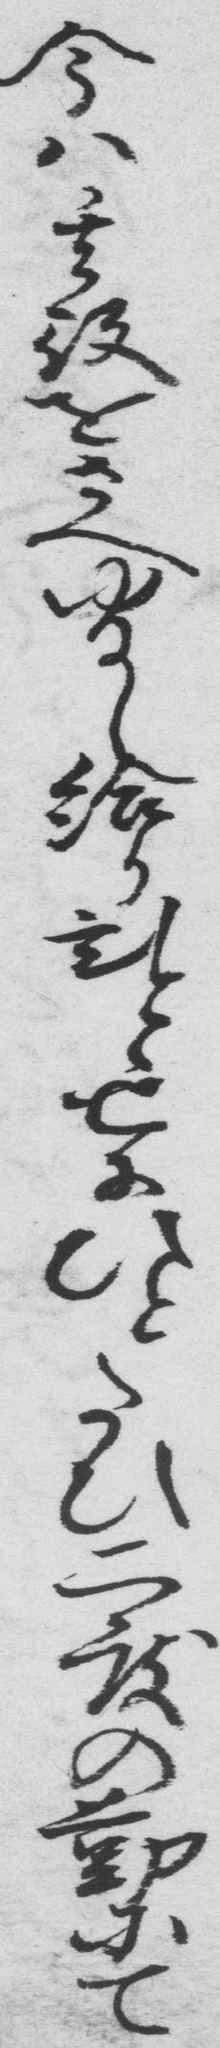今は其役をさへゆるし給りひとゝせにひとたひ二度の勤にて
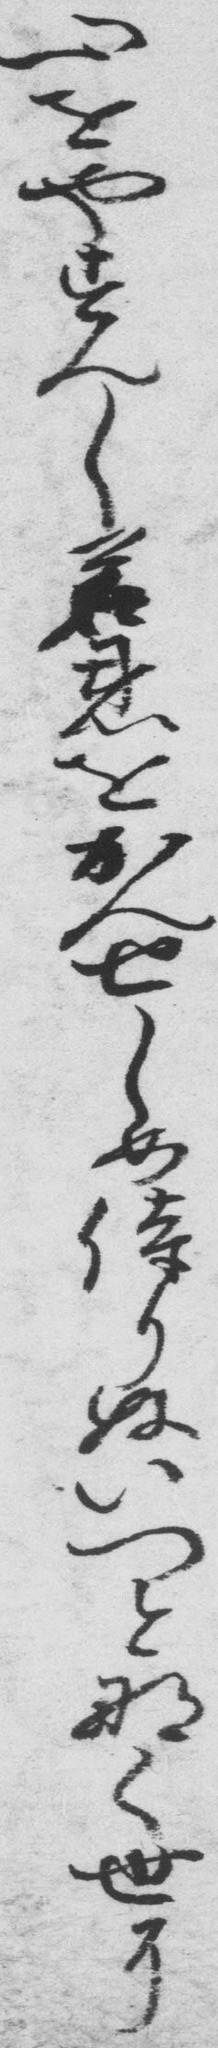心をやすんし君恩をかんせしめ侍りぬいつとなく世に
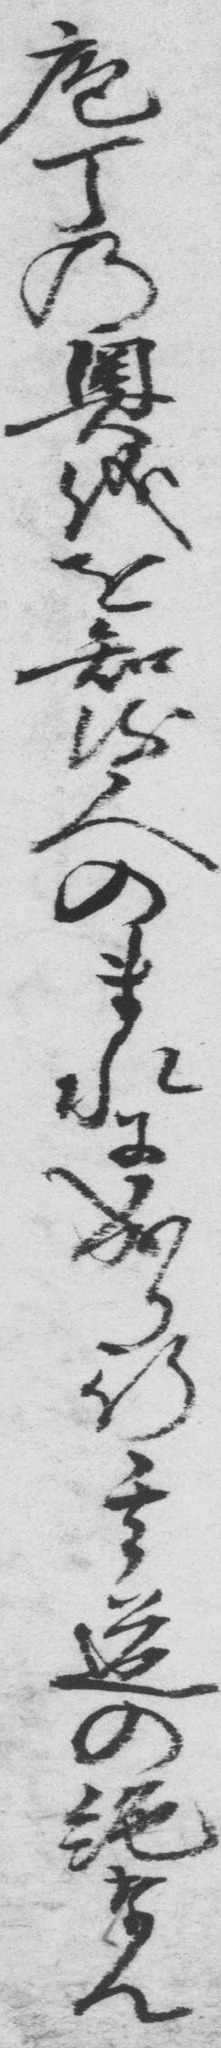庖丁の奥儀を知る人のまれに成り行其道の絶なん
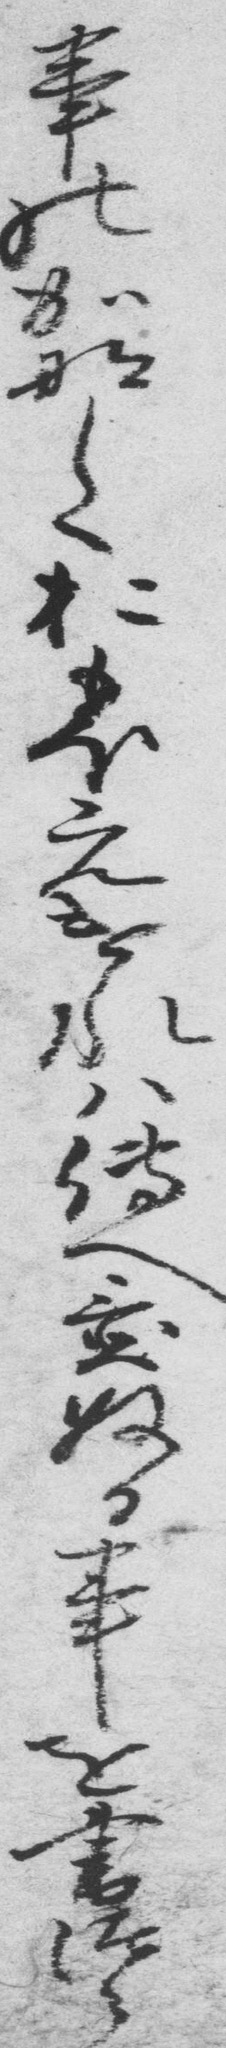事のかなしくおもほえけれは伝へ置ぬる事を書つら

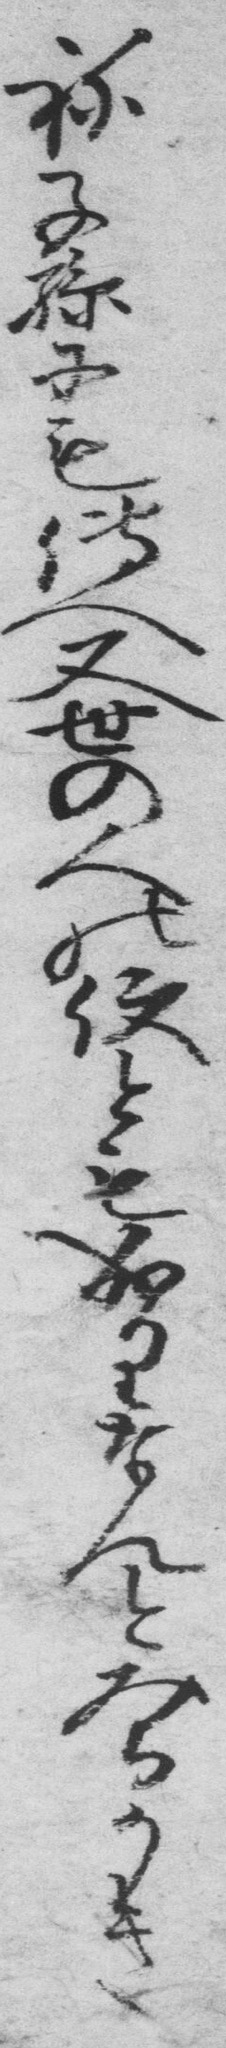ね子孫にも伝へ又世の人の便とも成りなんとみちかき
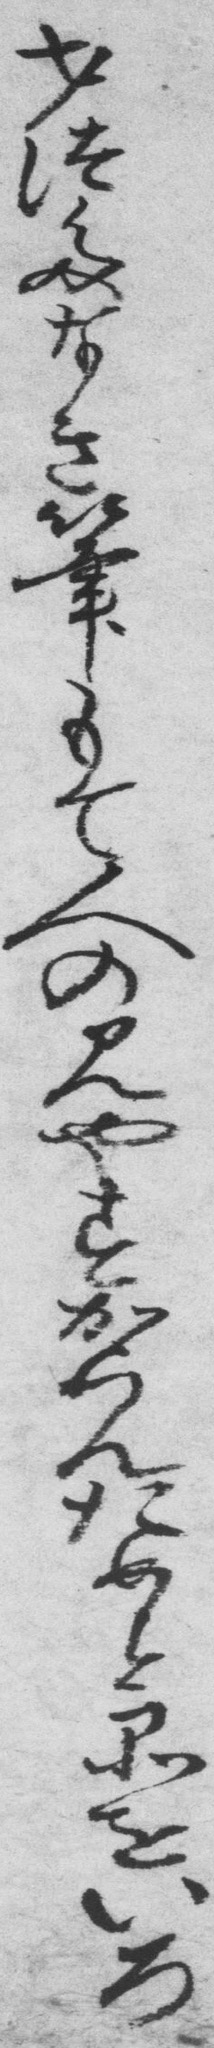才つたなき筆もて人の見やすからんためと品をいろ
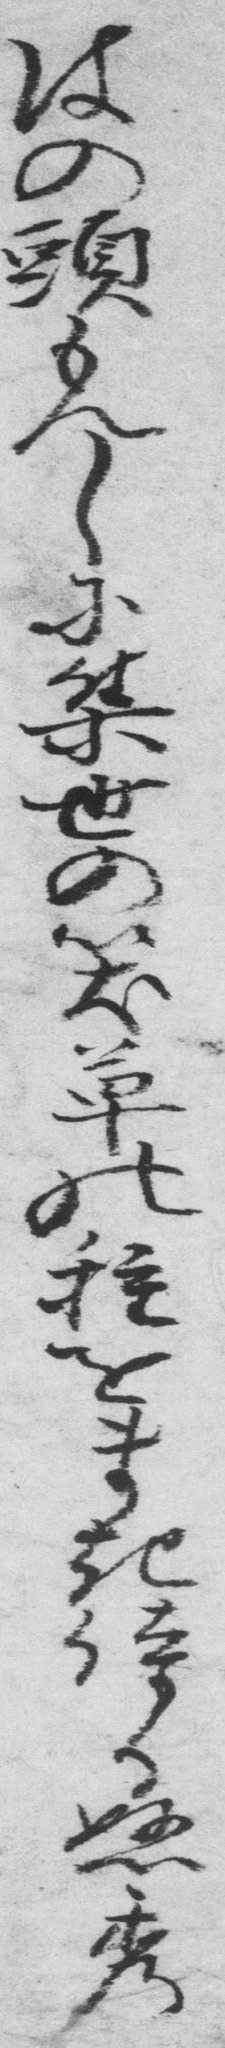はの頭もんしに集世の笑草の種をまき侍りぬ秀
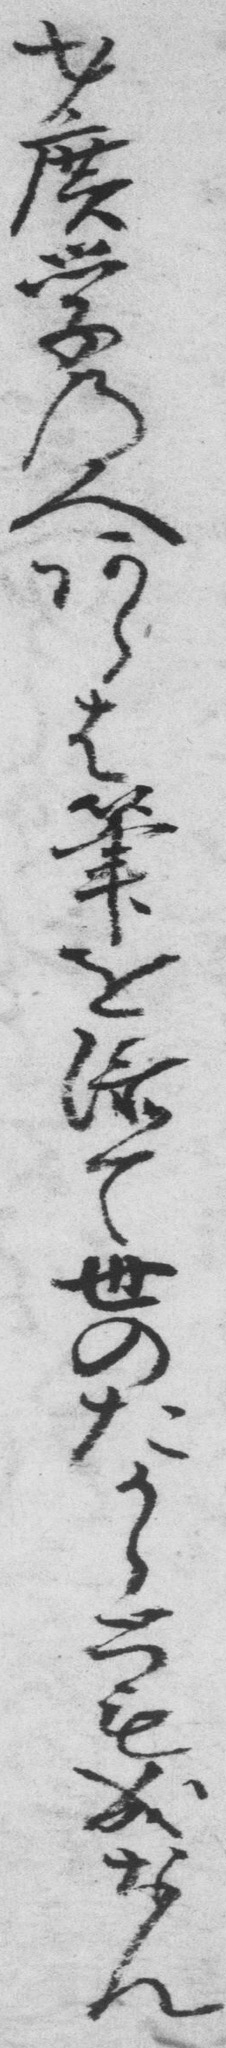才広学の人あらは筆を添て世のたからとも成なん
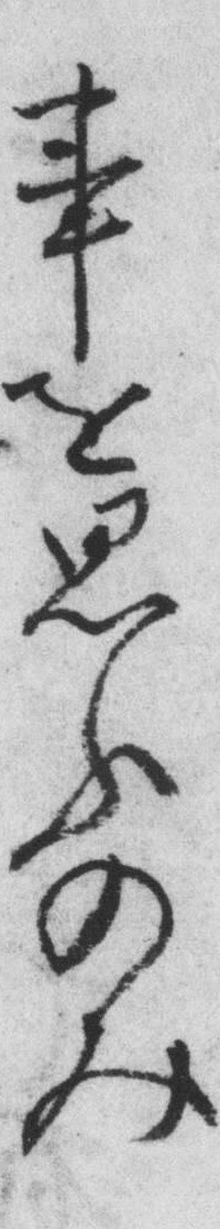事を思ふのみ
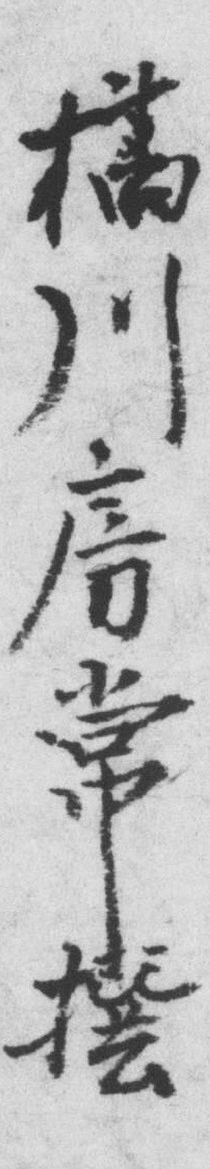橘川房常撰
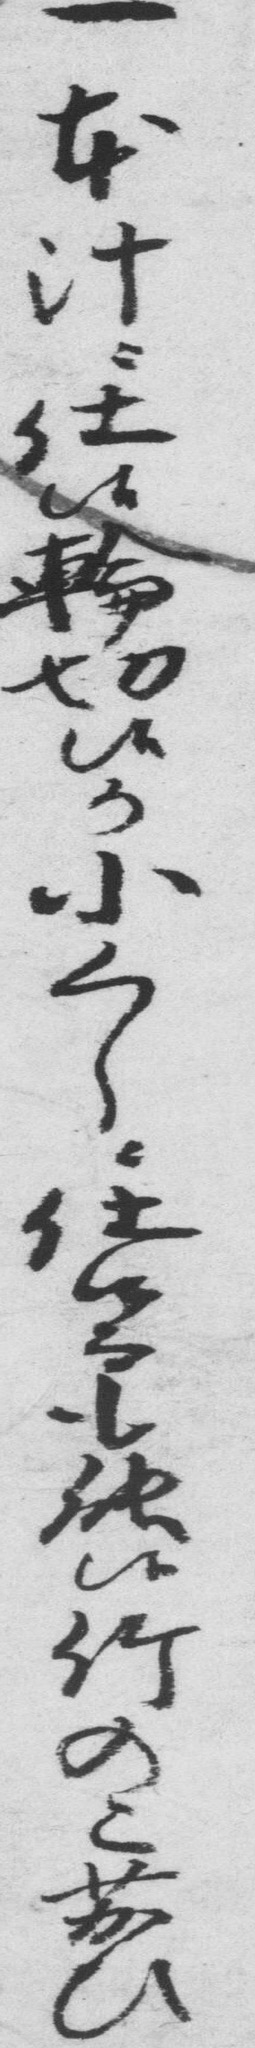一本汁に仕候輪切候か小くしに仕候ても能候竹のこ茄ひ
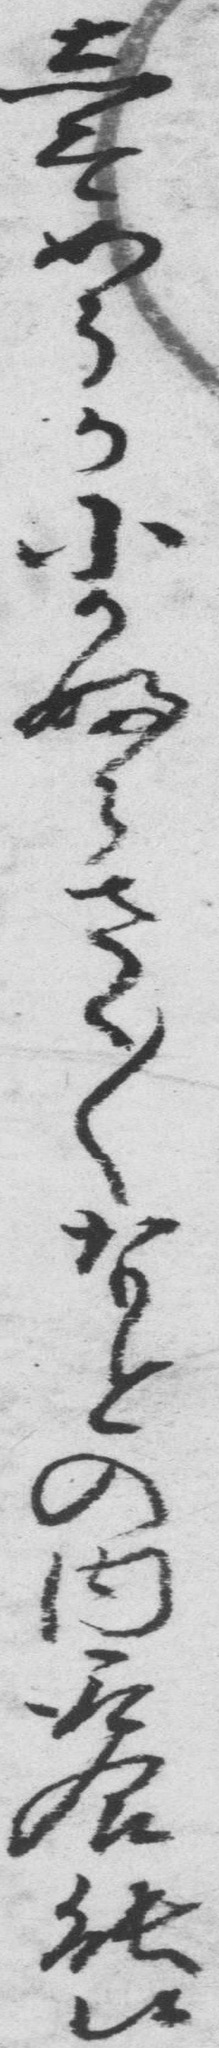しそめうか小かふらさく〳〵なとの内取合能候
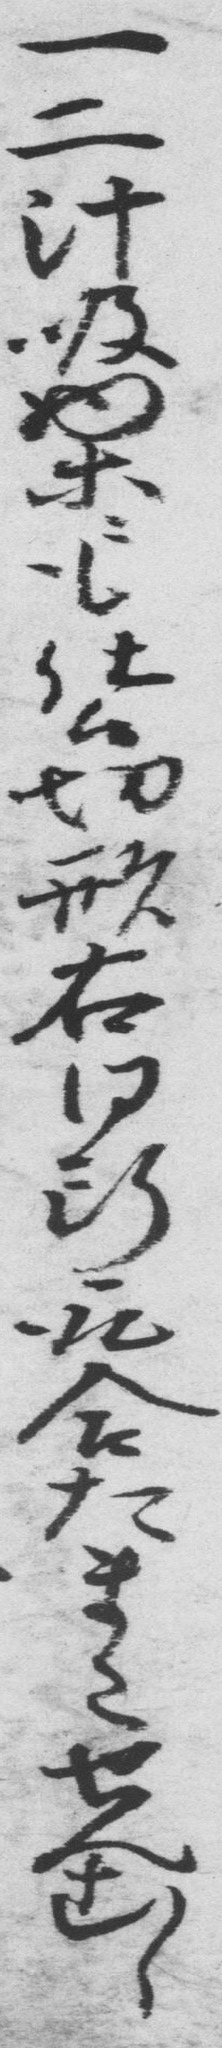一二汁吸物等にも仕候切形右同断取合たまこせんむし
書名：料理集
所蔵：大阪府立大学学術情報センター 国文学研究資料館
